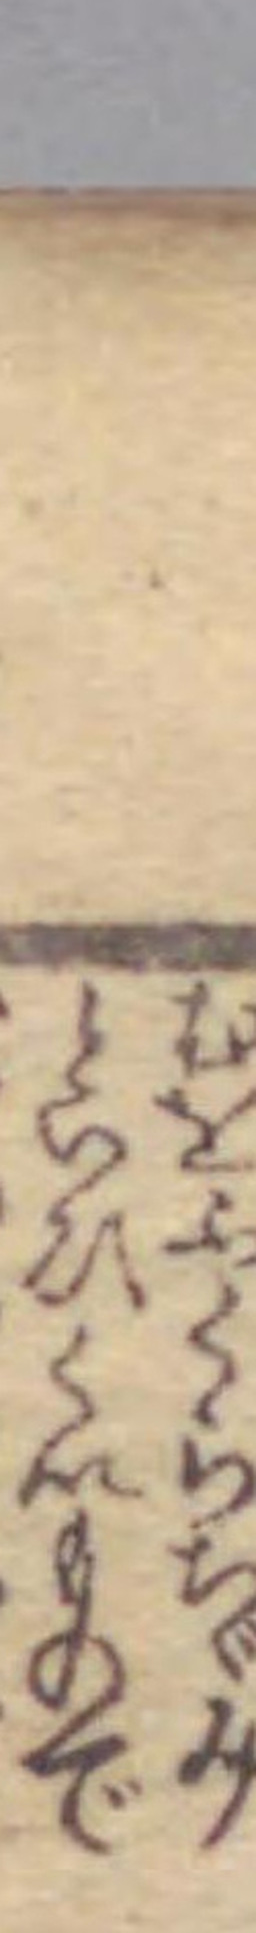といひくいもので
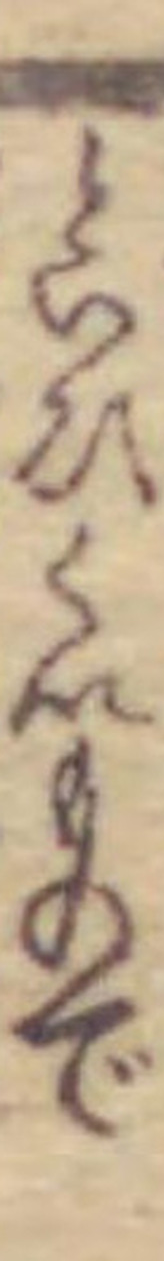といひくいもので
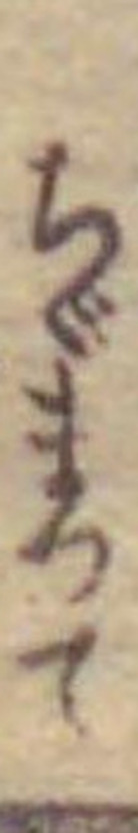ちゞまつて
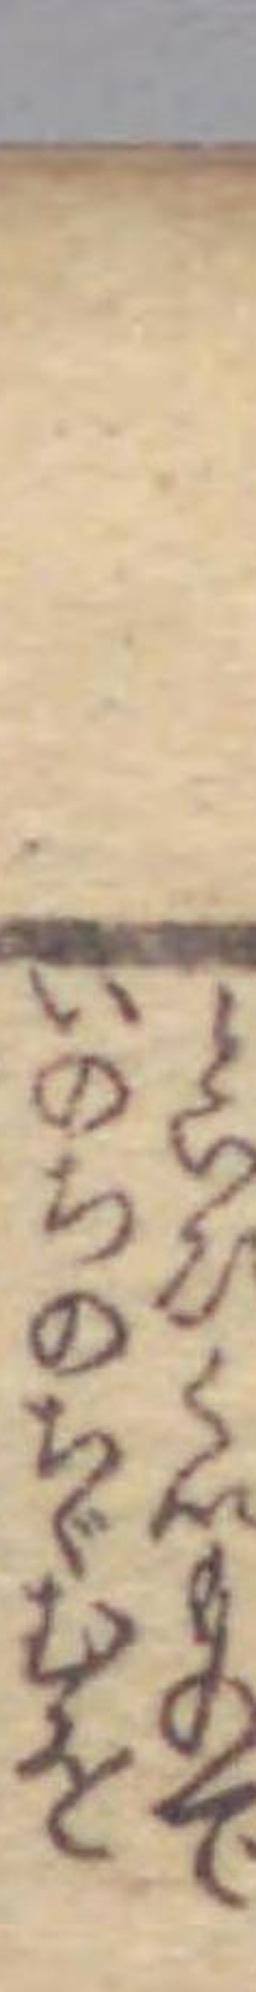いのちのちゞむを
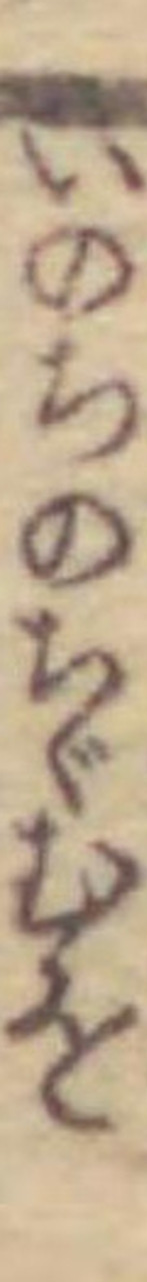いのちのちゞむを
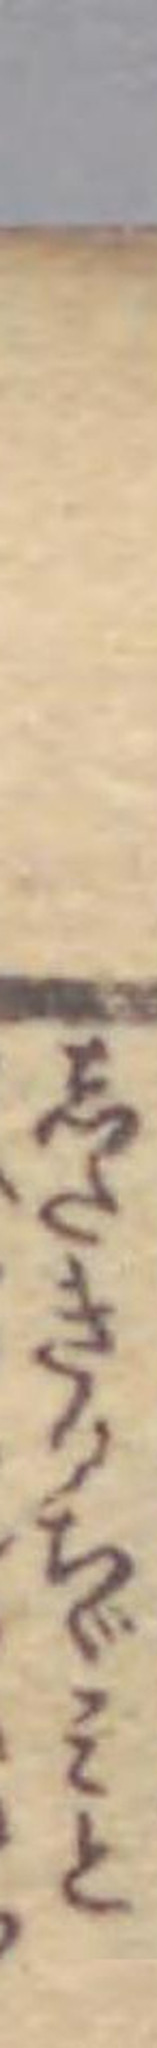したきりちゞみと
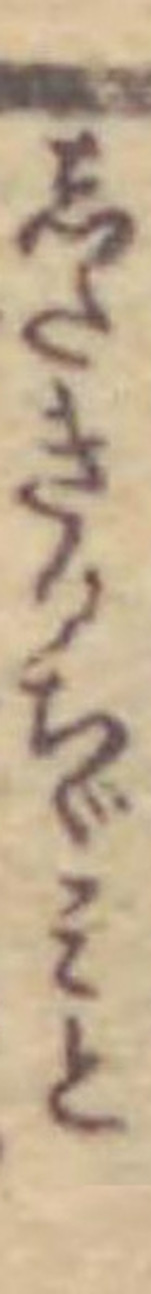したきりちゞみと
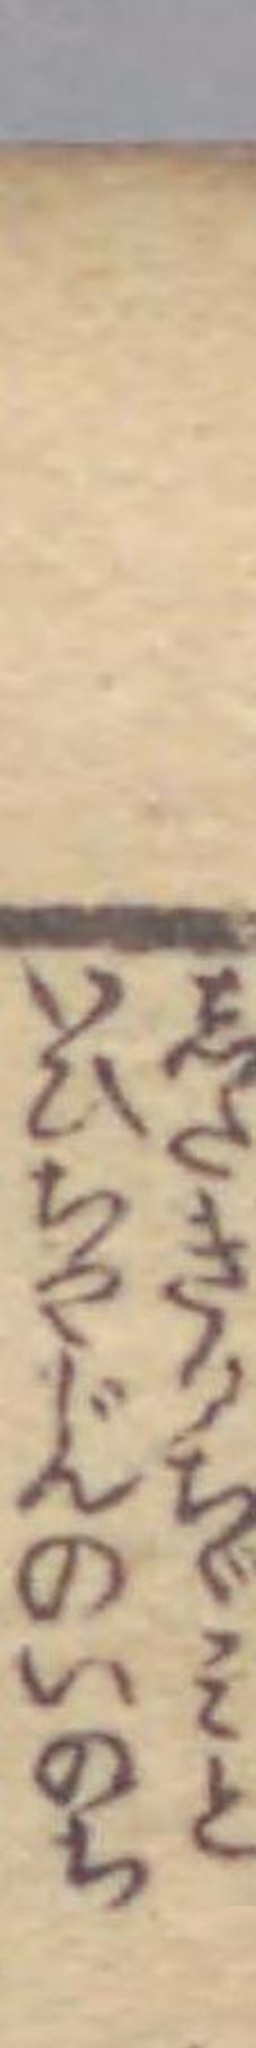いひちやじんのいのち
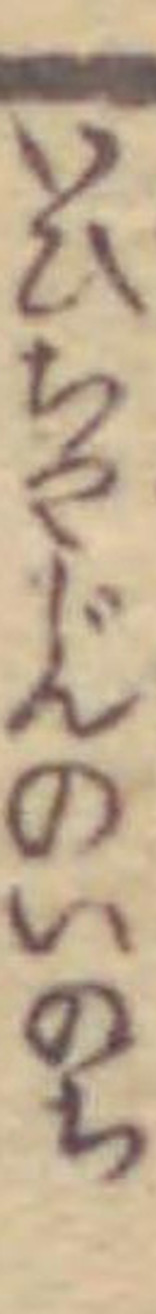いひちやじんのいのち
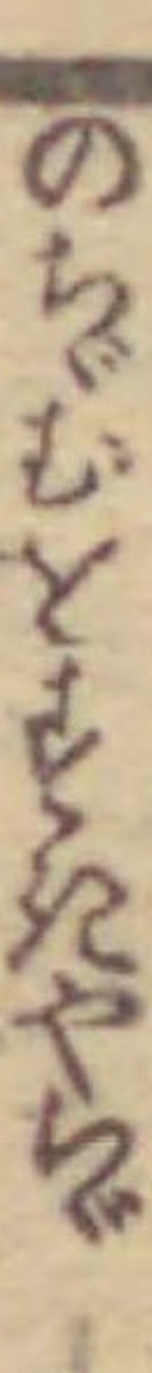のちゞむをすきやちゞ
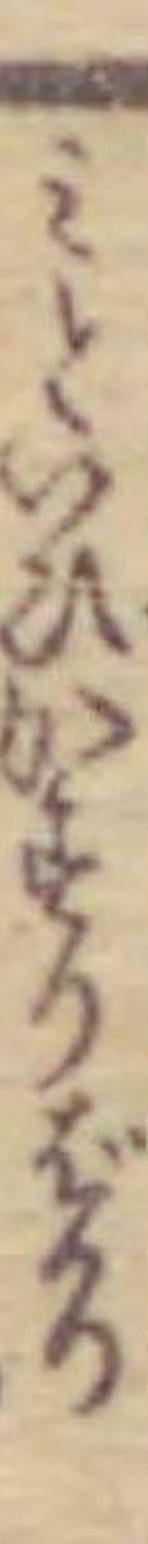みといひかすりばかり
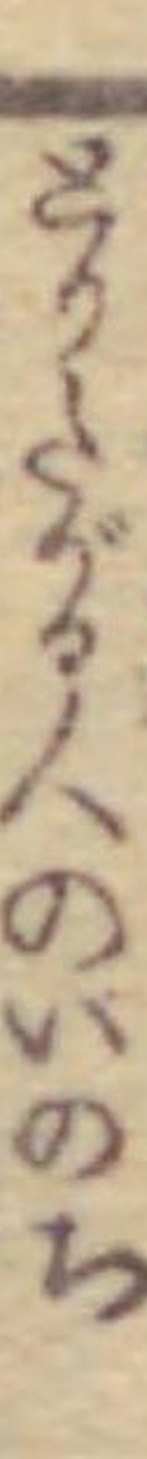とりたがる人のいのち
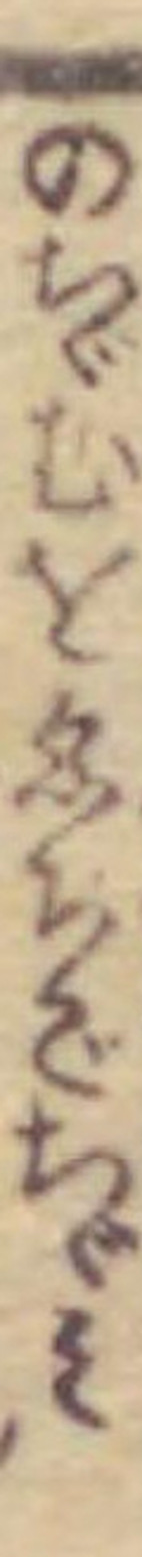のちゞむをゑちごちゞみ
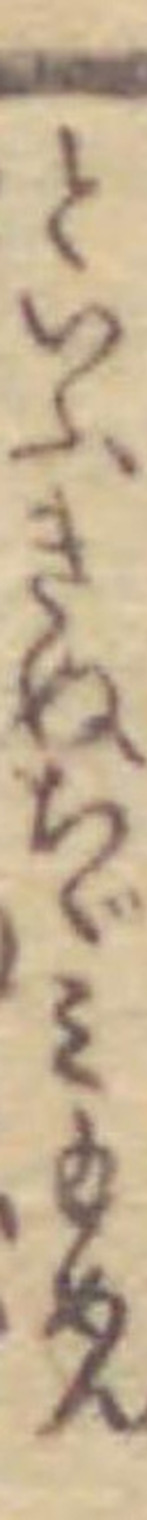といふきぬちゞみもめん
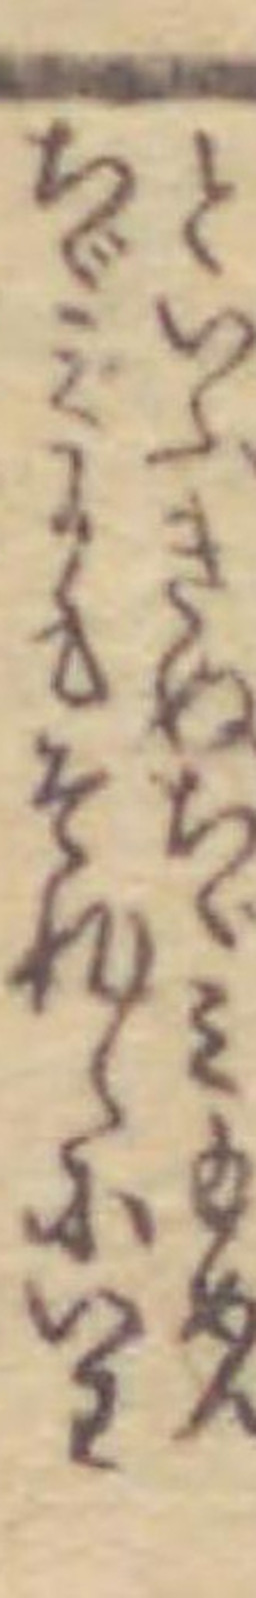ちゞみにもそれ〳〵にいわ
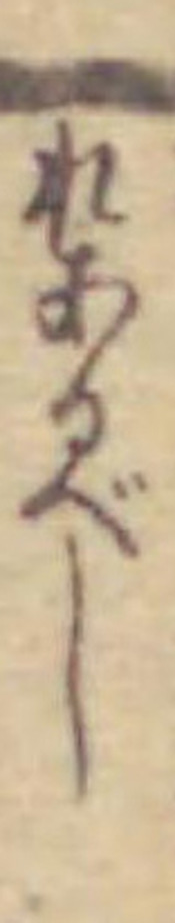れあるべし
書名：御誂染長寿小紋 : 3巻
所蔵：国立国会図書館 National Diet Library, JAPAN
